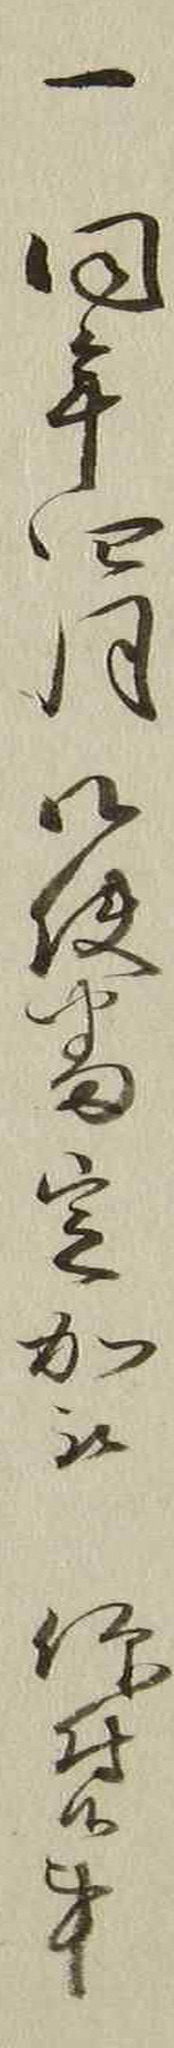一同年四月御使番定加被仰付候事
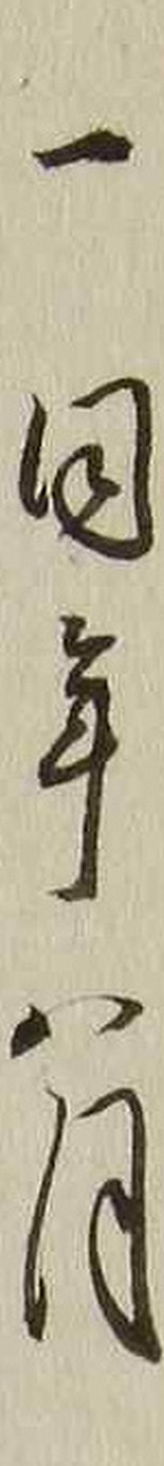一同年八月
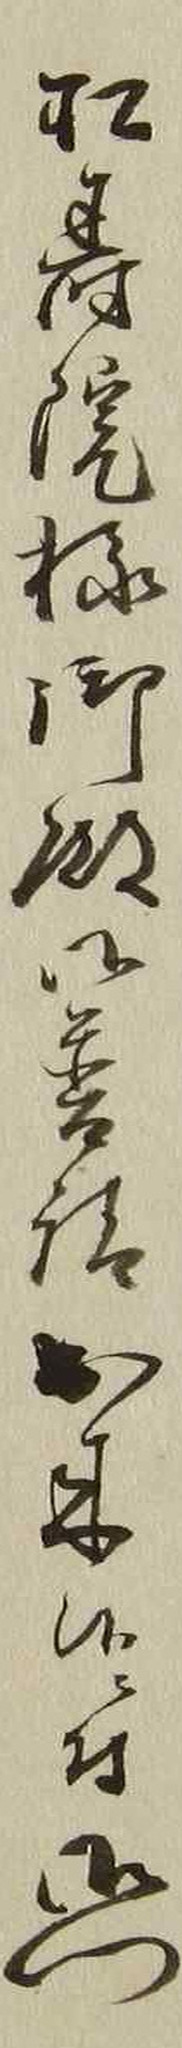松寿院様御殿御普請出来候ニ付御門
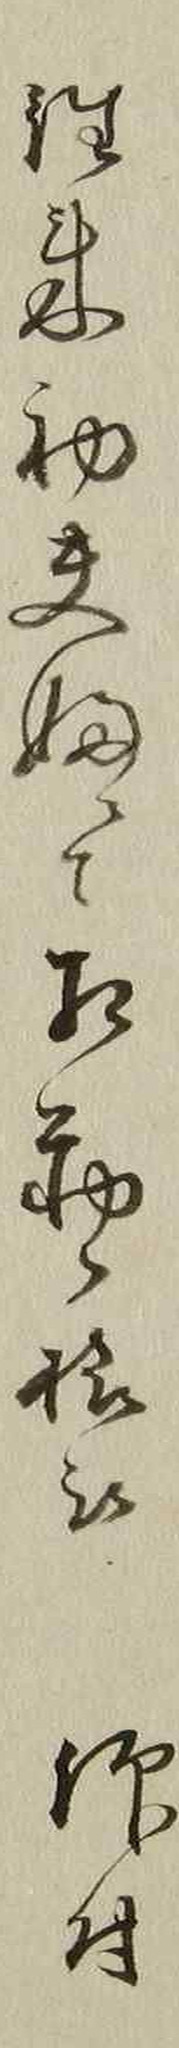往来初夫婦ニて相勤候様被仰付
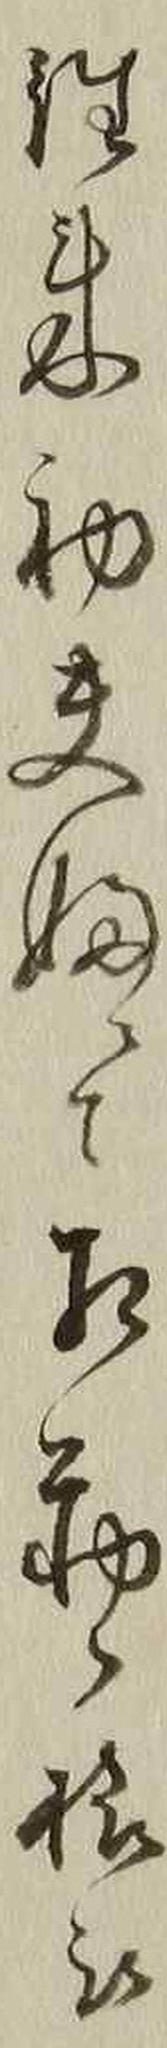往来初夫婦ニて相勤候様被仰付
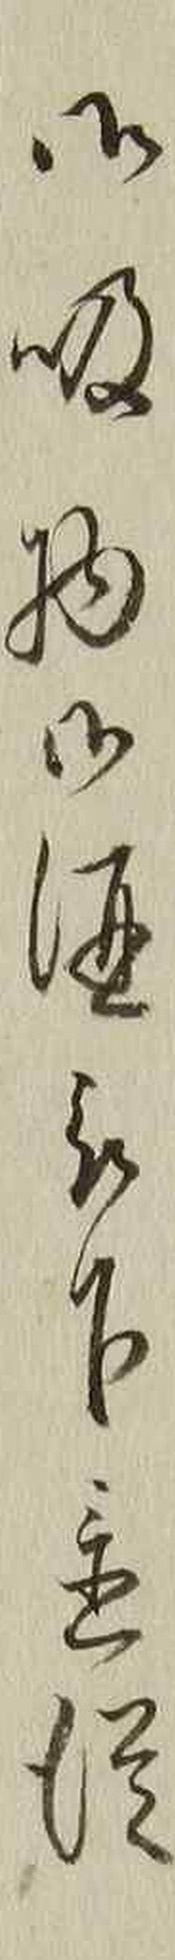御吸物御酒被下置従
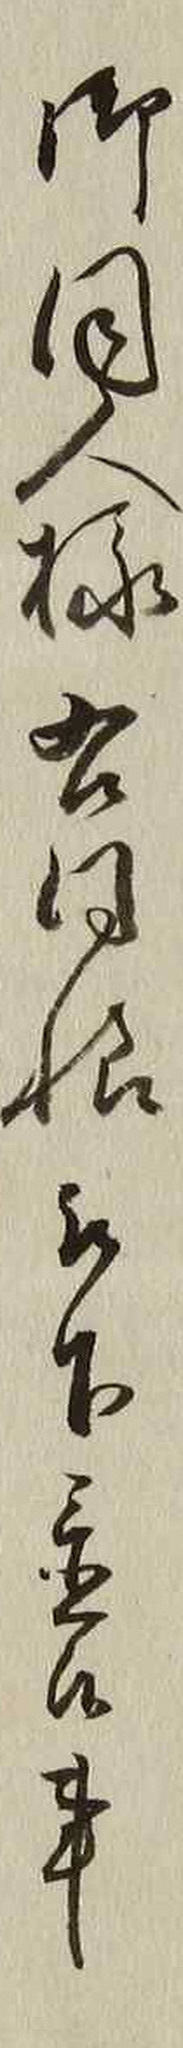御同人様右同様被下置候事
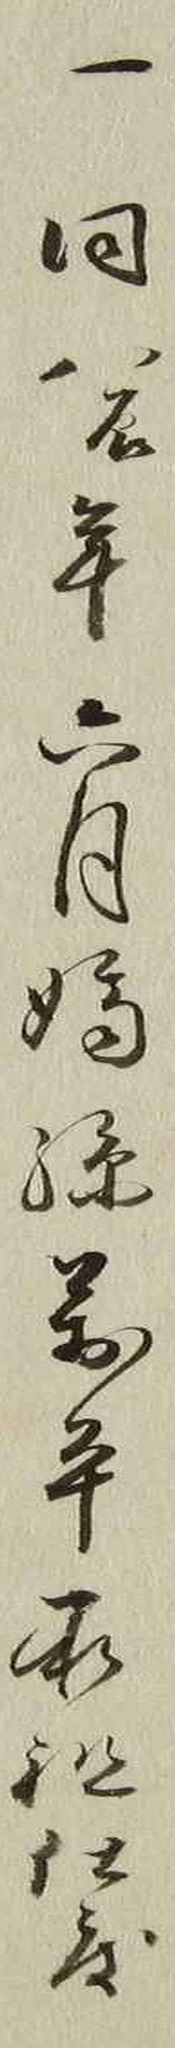一同八辰年六月嫡孫万平承祖仕度
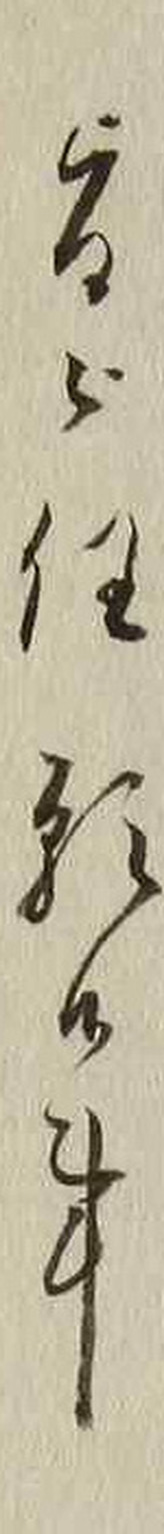旨被任願候事
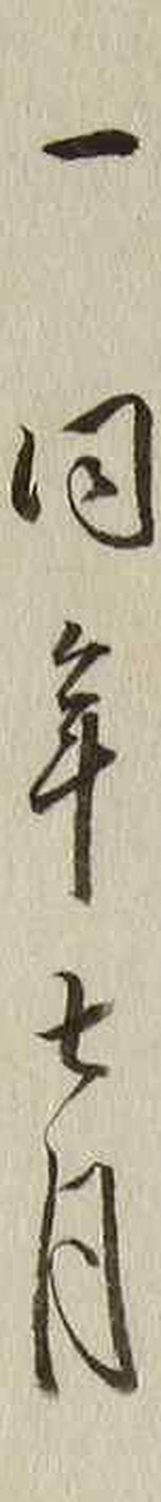一同年七月
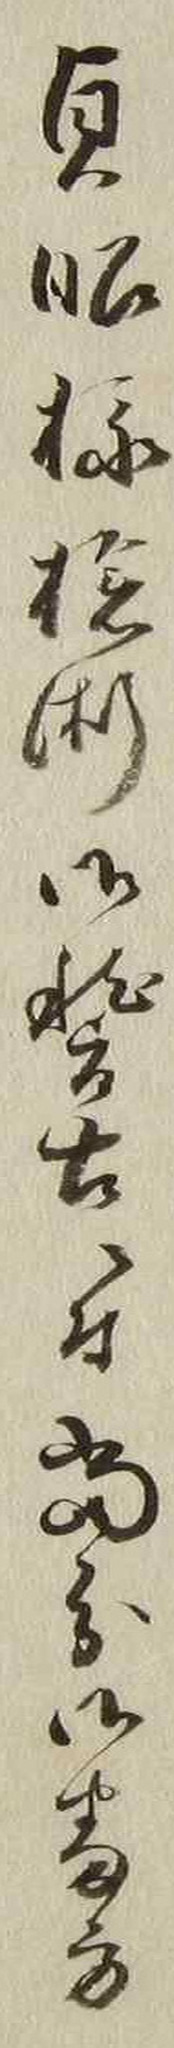貞昭様槍術御稽古ニ付当分御番方
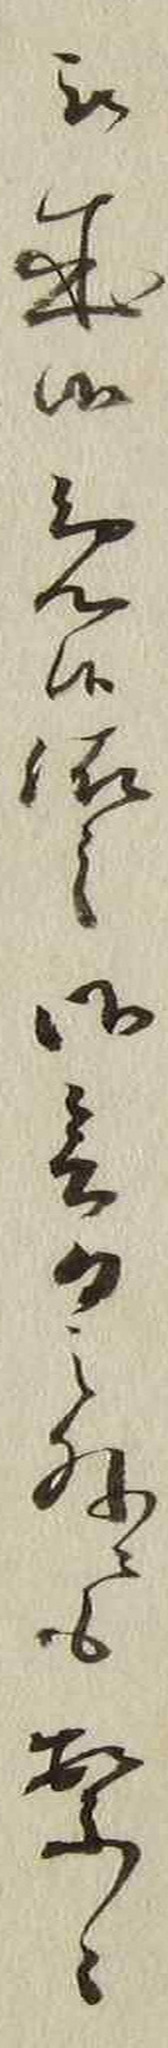被成御免候依之御会日之外ニも繁々
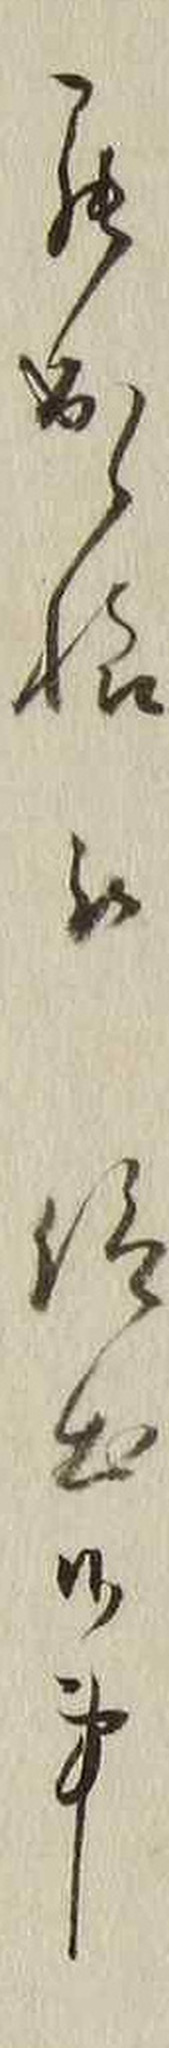罷出候様被仰出候事
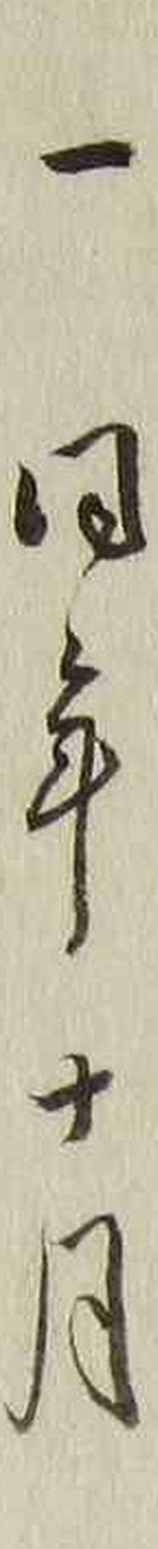一同年十月
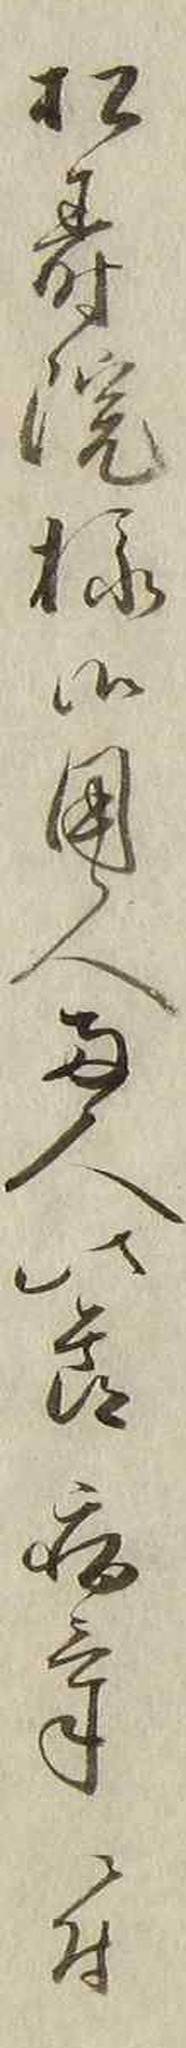松寿院様御用人両人此節病気ニ付
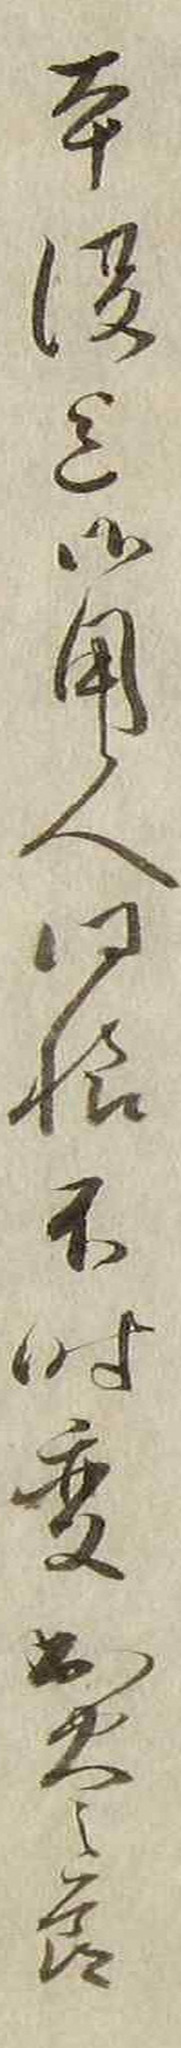本復迄御用人同様不時変出火之節
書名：諸士系譜　巻之28　い之部28
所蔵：会津若松市立会津図書館
